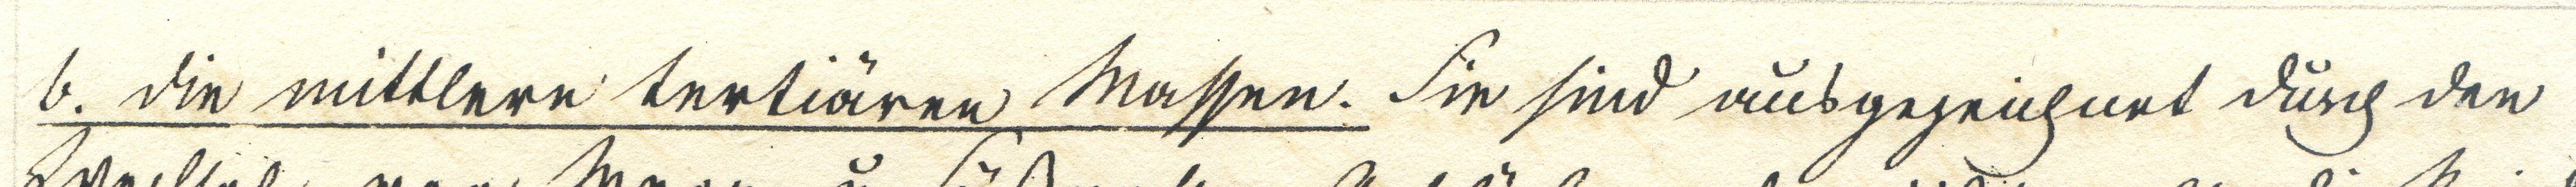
b. Die mittlern tertiären Massen. Sie sind ausgezeichnet durch den
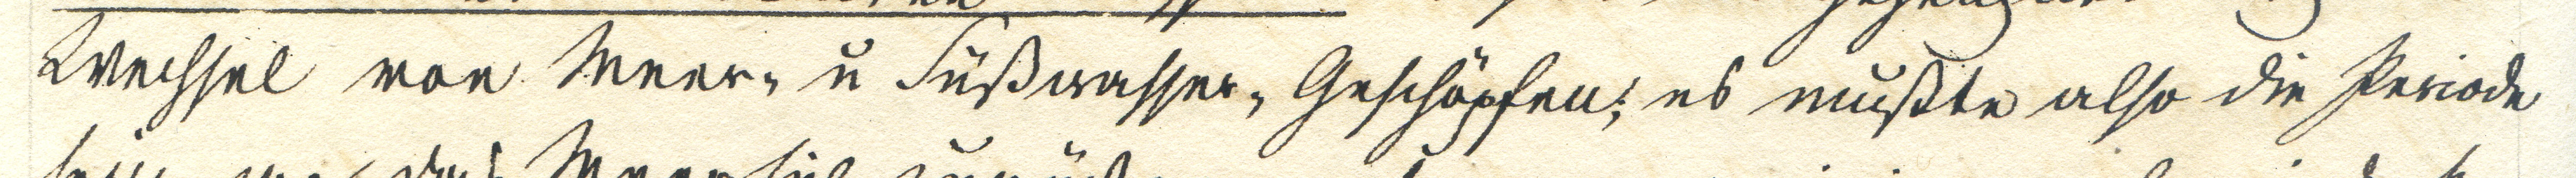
Wechsel von Meer- u Süßwasser-Geschöpfen; es müßte also die Periode
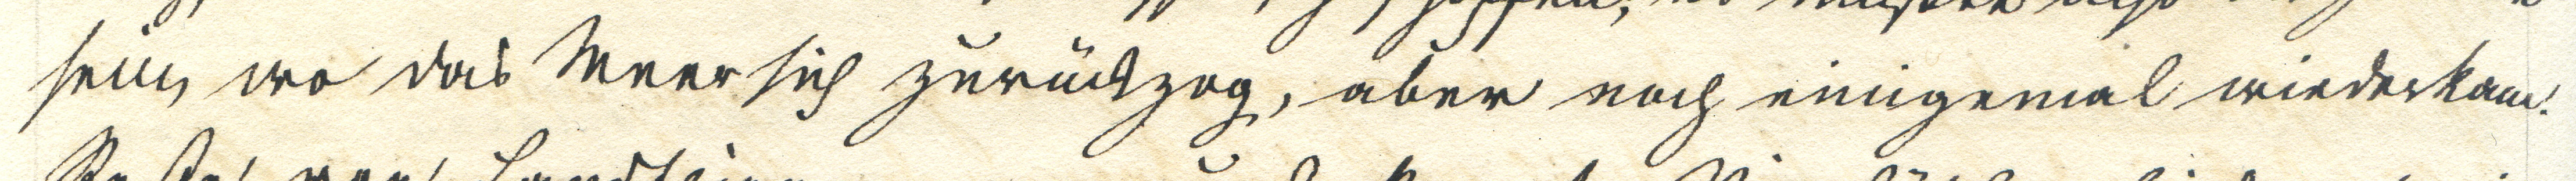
sein, wo das Meer sich zurückzog, aber noch einigemal wiederkam.
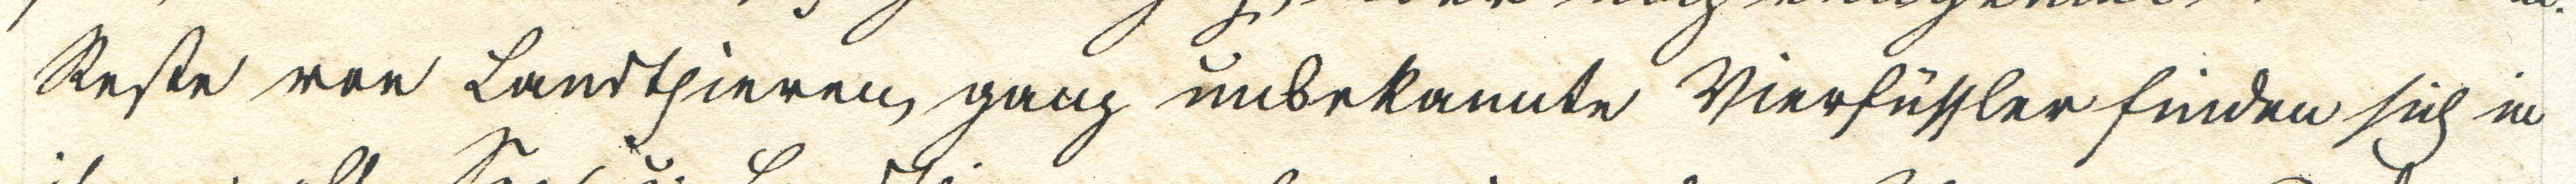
Reste von Landthieren, ganz unbekannte Vierfüssler finden sich in
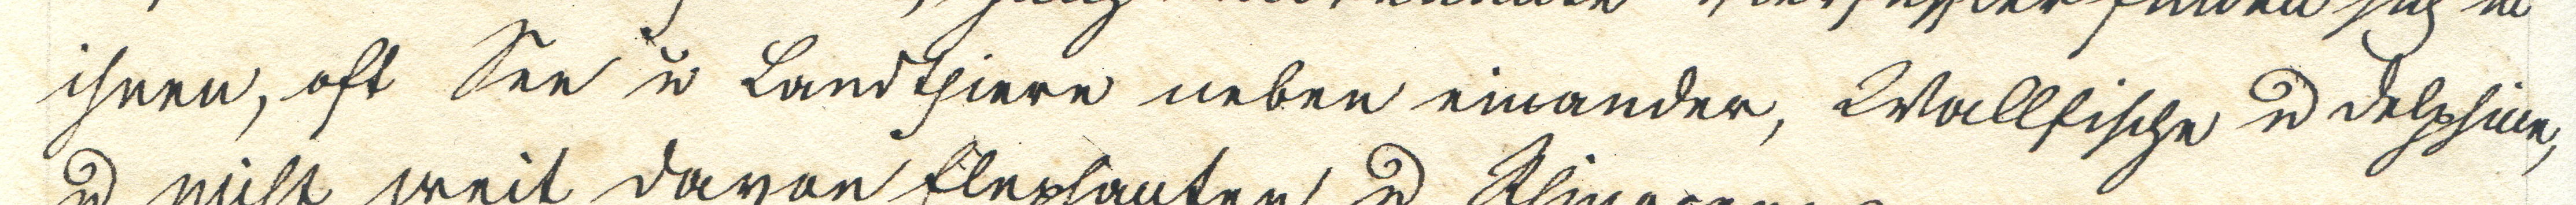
ihnen, oft See u Landthiere neben einander, Wallfische u Delphine,
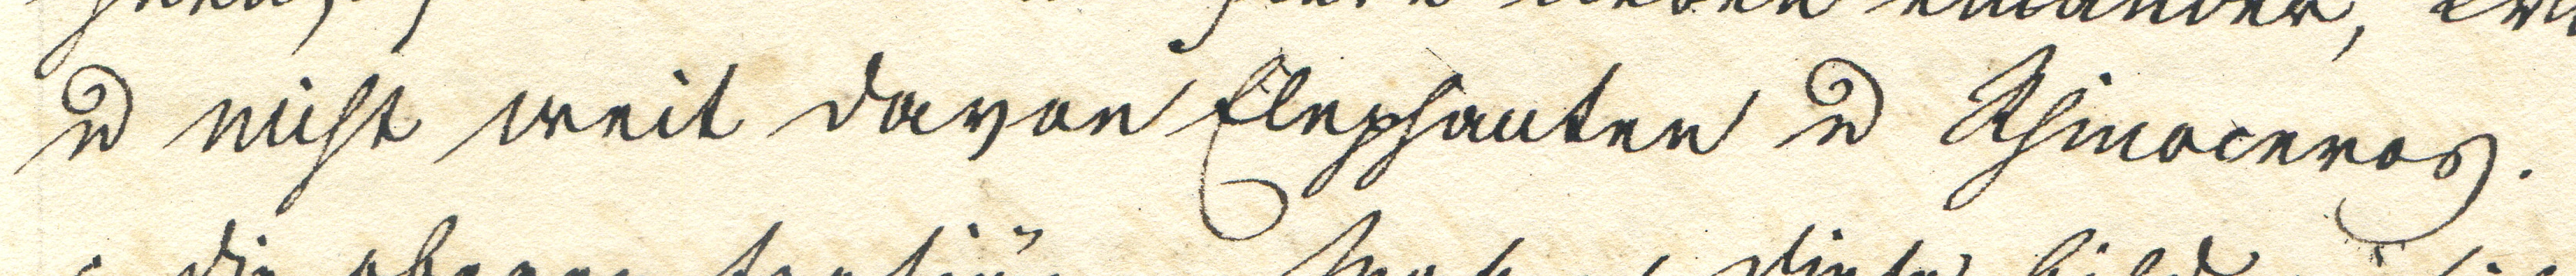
u nicht weit davon Elephanten u Rhinoceros.
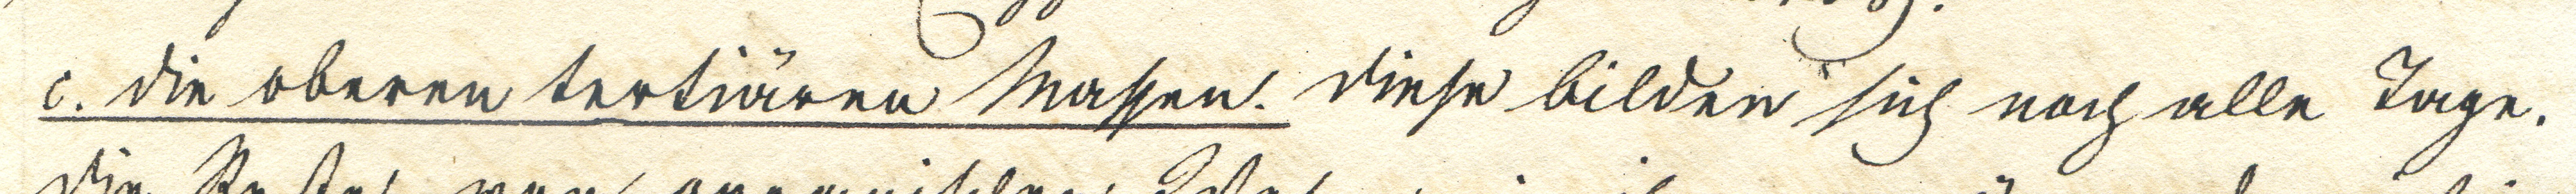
c. Die oberen tertiären Massen. Diese bilden sich noch alle Tage.
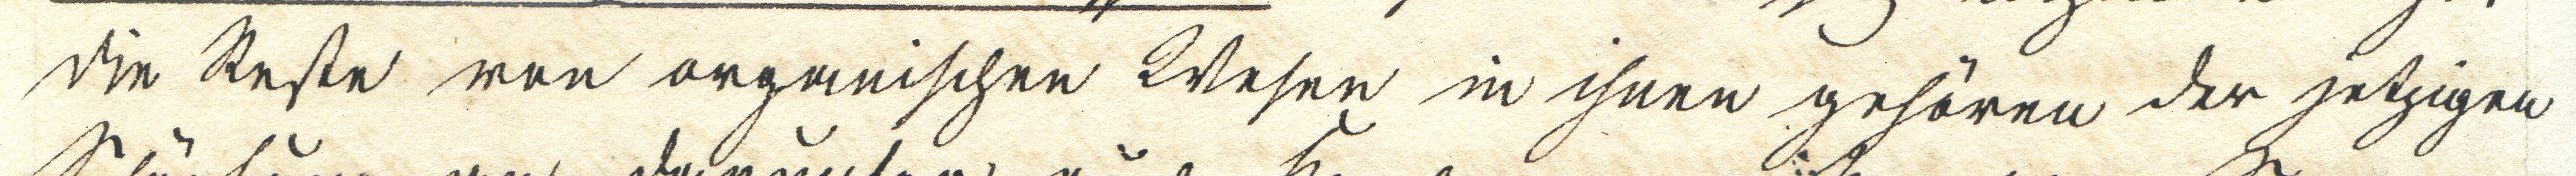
Die Reste von organischen Wesen in ihnen gehören der jetzigen
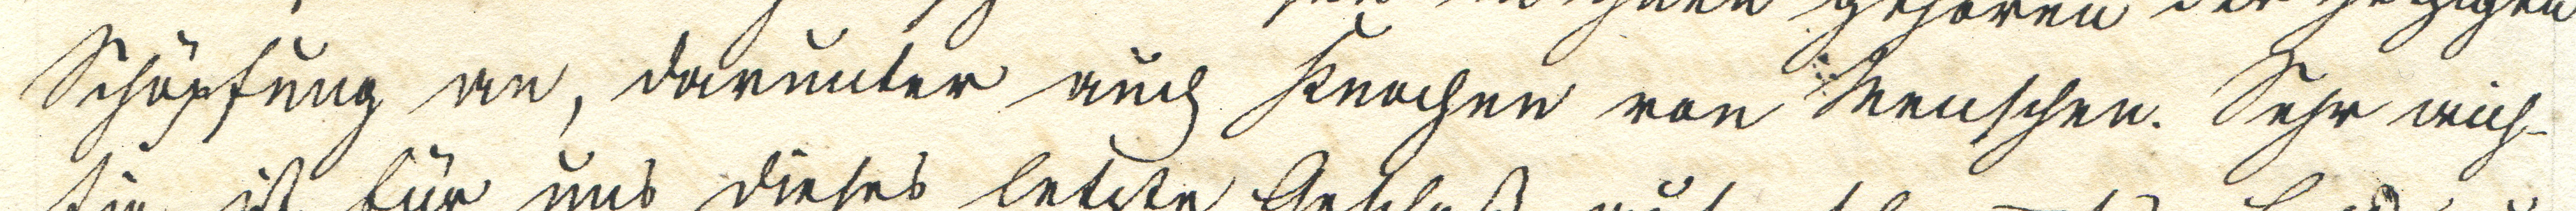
Schöpfung an; darunter auch Knochen von Menschen. Sehr wich-
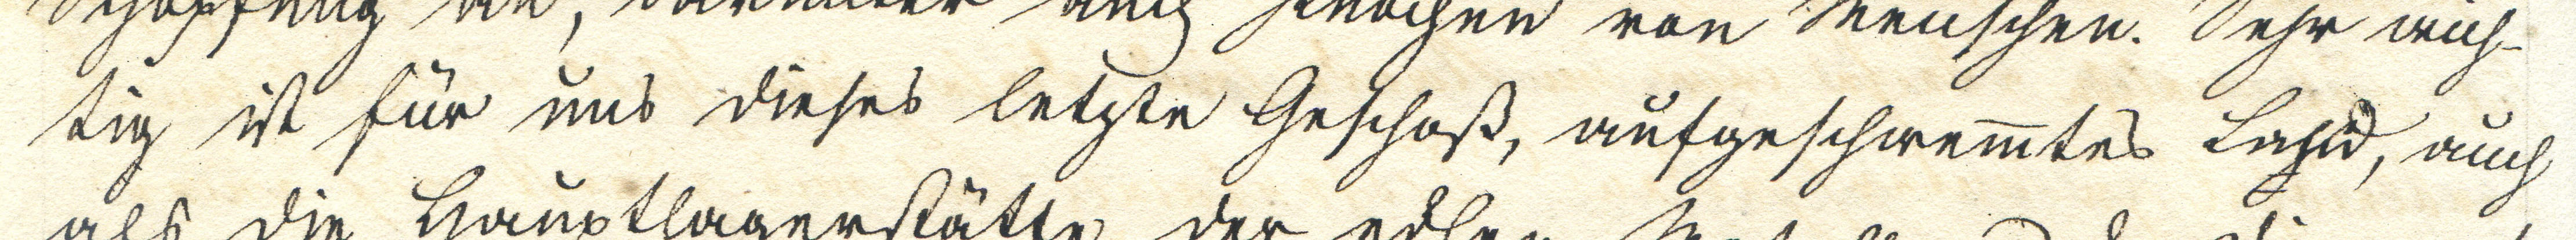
tig ist für uns dieses letzte Geschoß, aufgeschwem̃tes Lahnd, auch
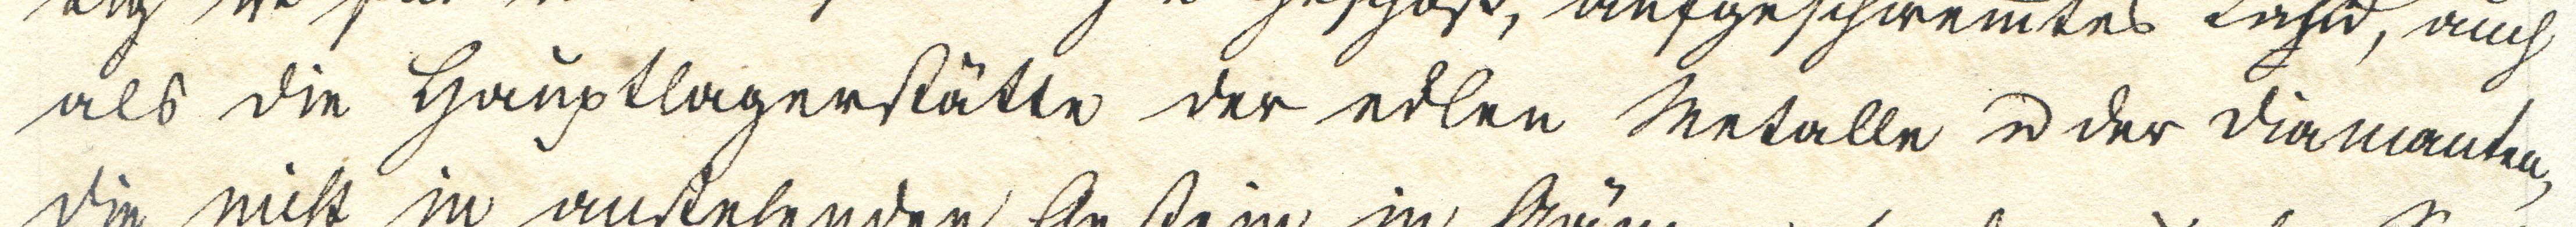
als die Hauptlagerstätte der edlen Metalle u der Diamanten,
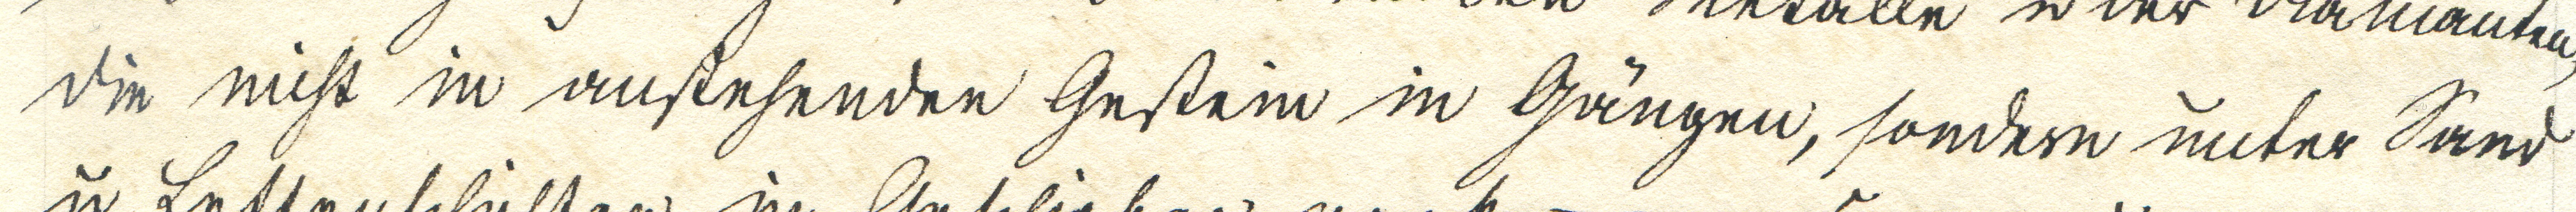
die nicht in Gestein in Gängen, sondern unter Sand
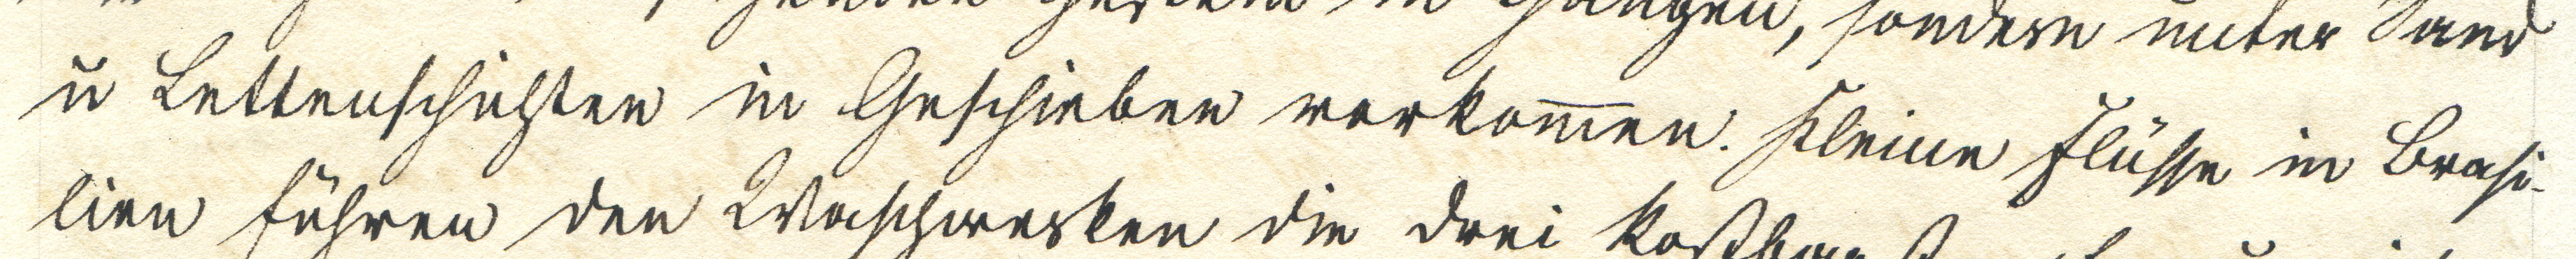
u Lettenschichten in Geschieben vorkom̃en. Kleine Flüsse in Brasi-
